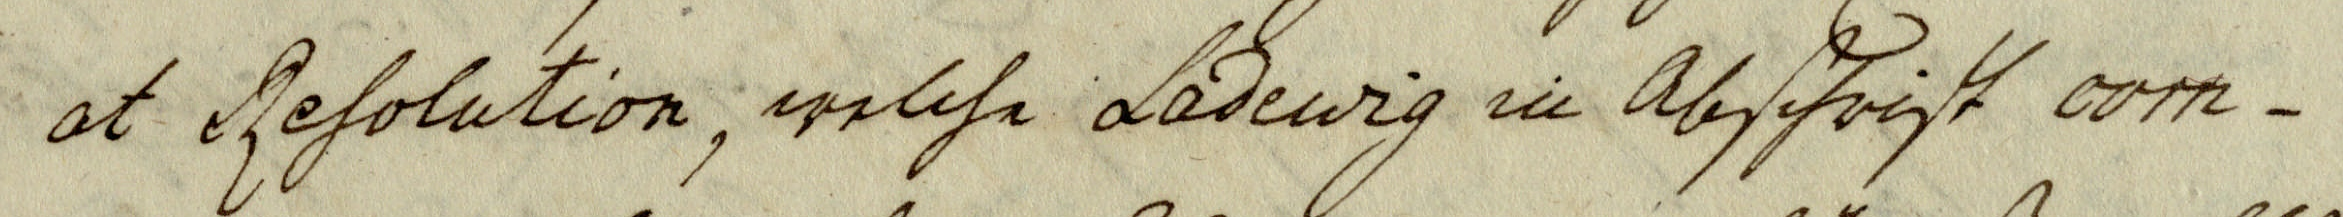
at Resolution, welche Ladewig in Abschrift com¬
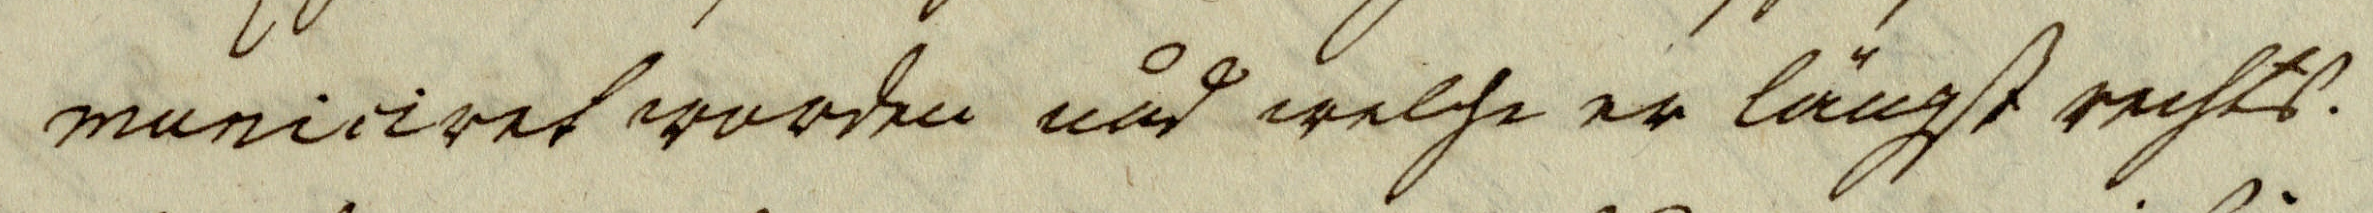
municiret worden und welche er längst rechts¬
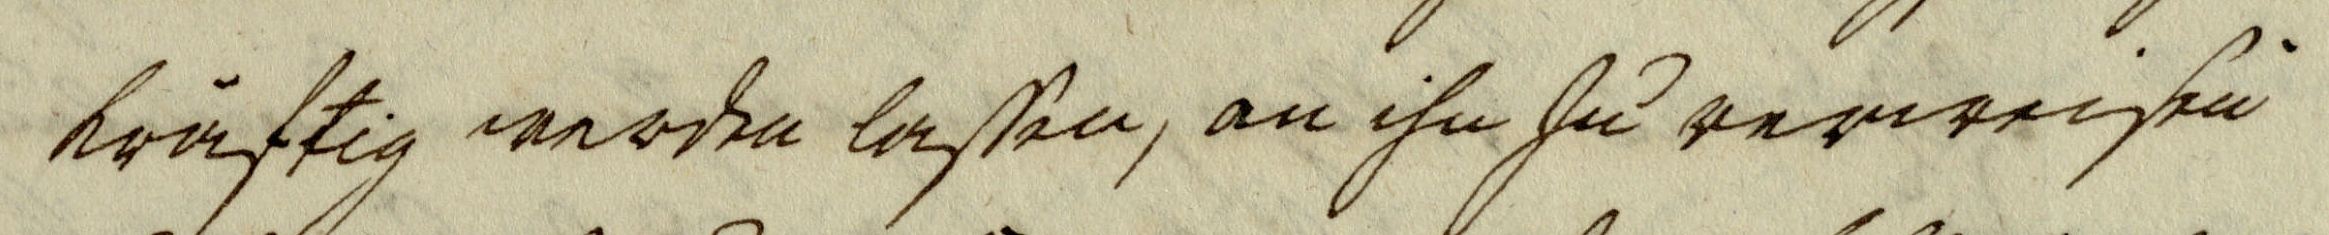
kräftig werden lassen, an ihn zu verweisen
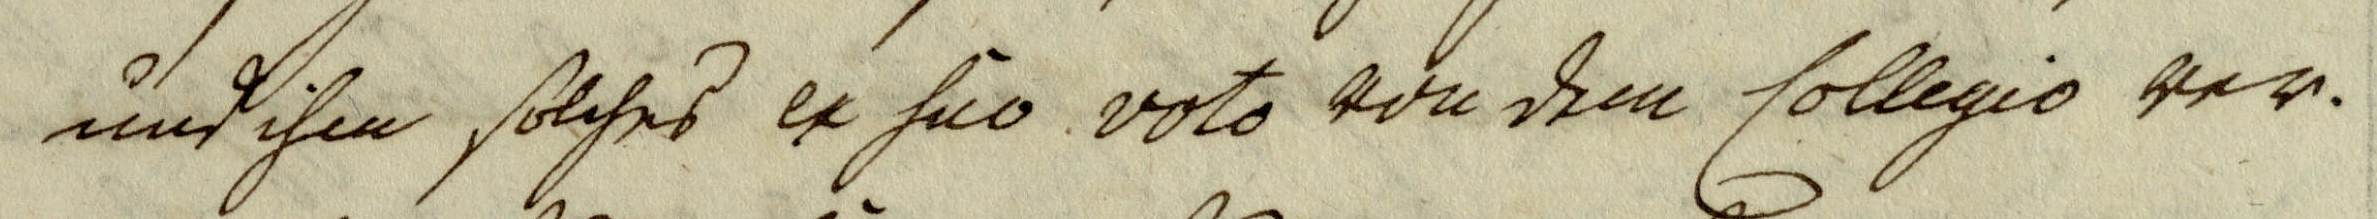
und ihm solches ex suo voto von dem Collegio ver¬
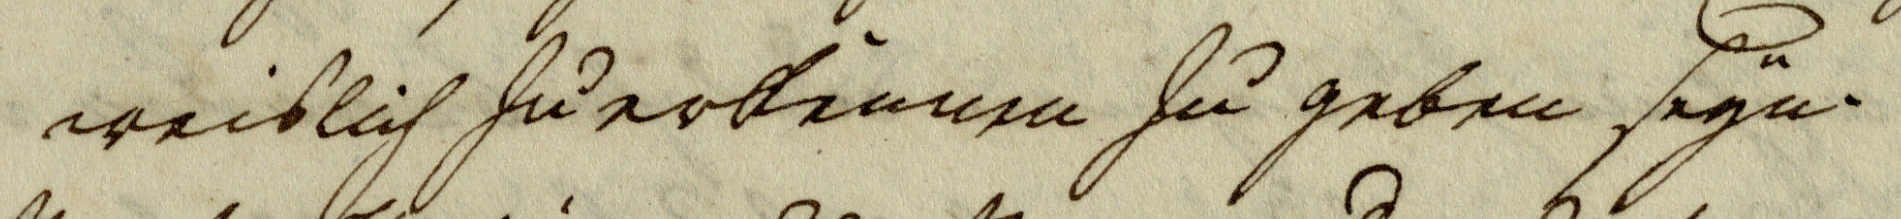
weislich zu erkennen zu geben seÿn.
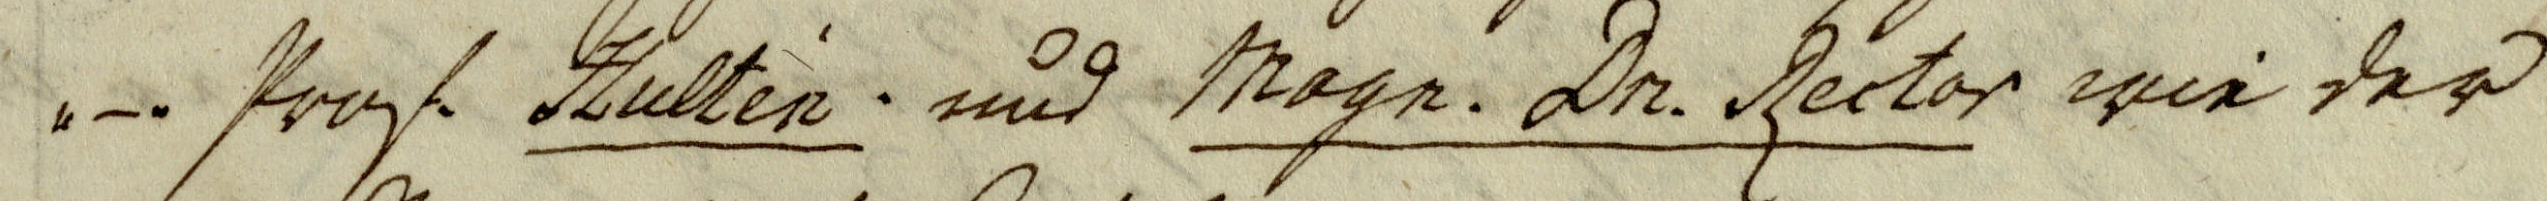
" — " Prof. Hultén und Magn. Dn. Rector wie der
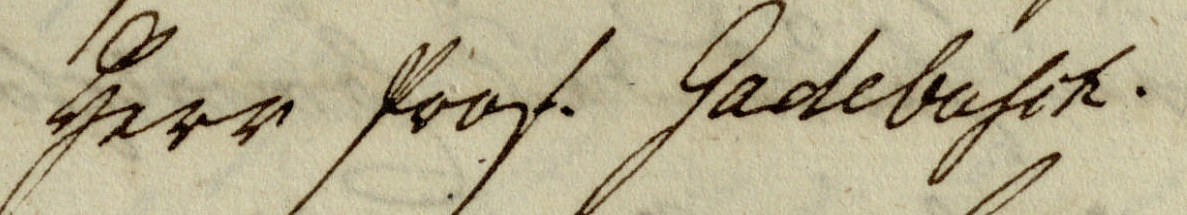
Herr Prof. Gadebusch.
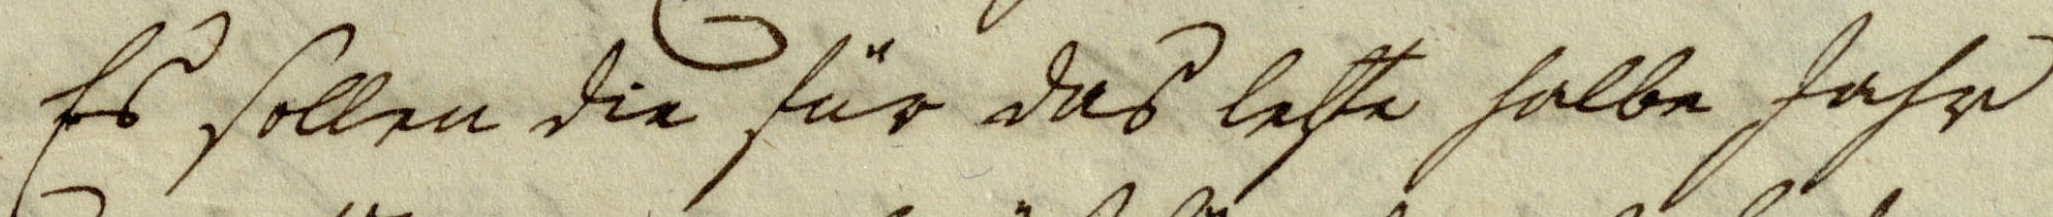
Es sollen die für das letzte halbe Jahr
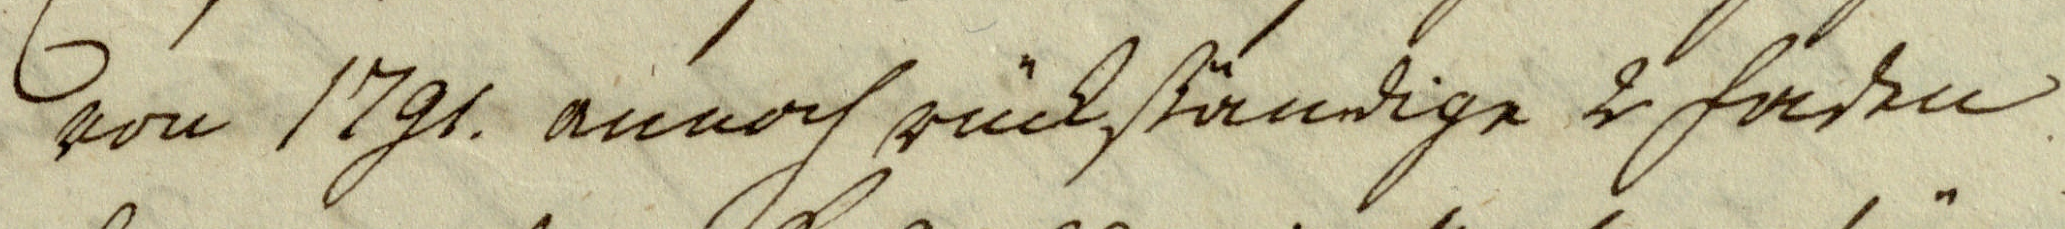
von 1791. annoch rückständiger 2 Faden
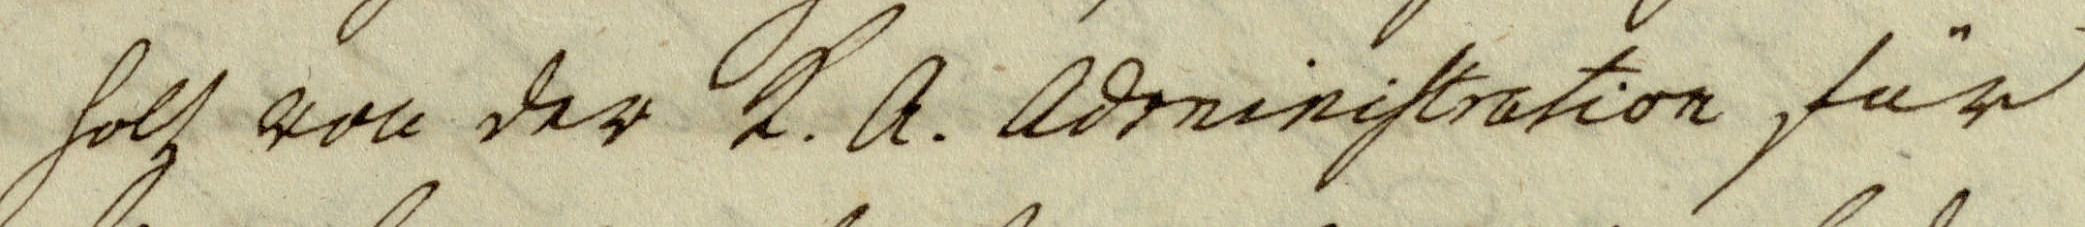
Holz von der K. A. Administration für
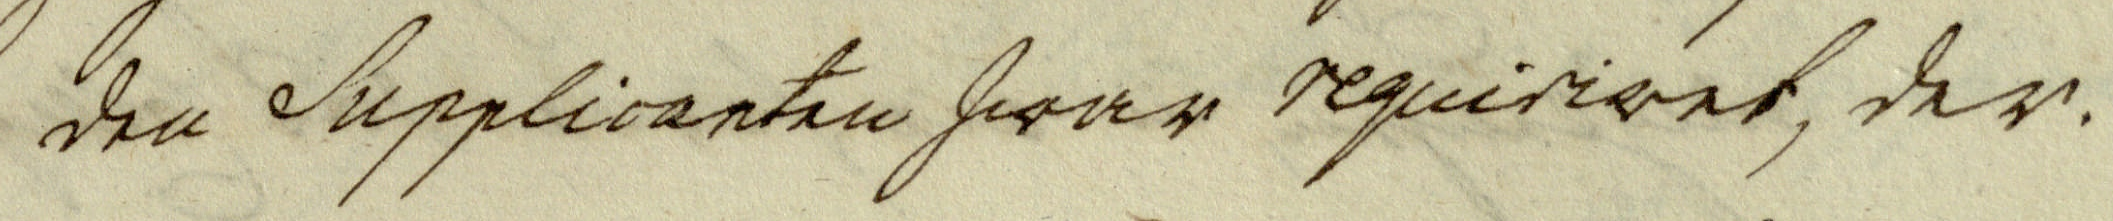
den Supplicanten zwar requirirt, der¬
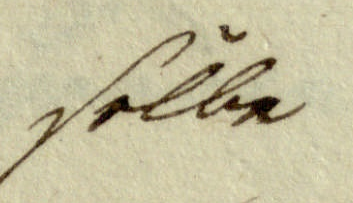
selbe
